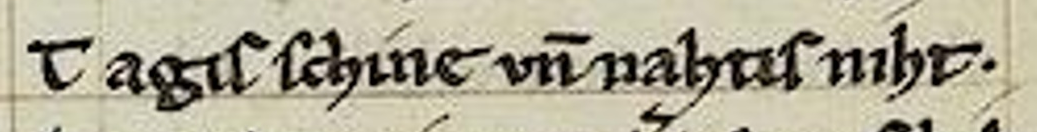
Tagiſ ſchine vn(d) nahtiſ niht.
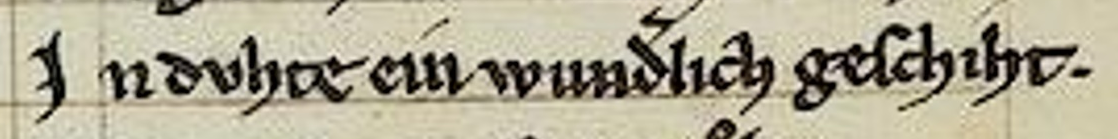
In dvhte ein wund(er)lich geſchiht.
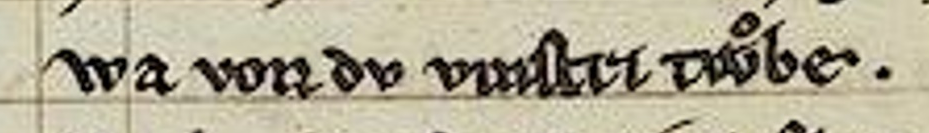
Wa von dv vinſtri trv°obe.
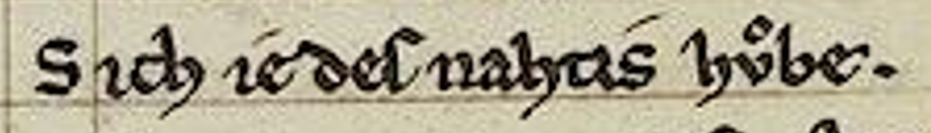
Sich ie deſ nahtis hv°obe.
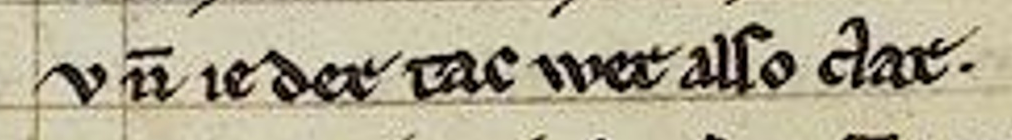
Vn(d) ie der tac wer alſo clar.
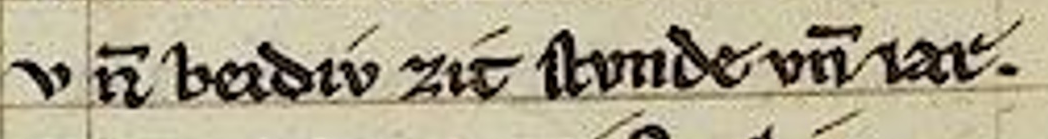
Vn(d) beidiv zit ſtvnde vn(d) iar.
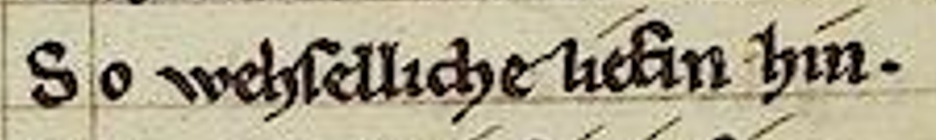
So wehſelliche liefin hin.
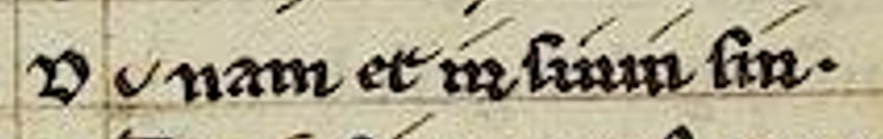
D(az) nam er in ſinin ſin.
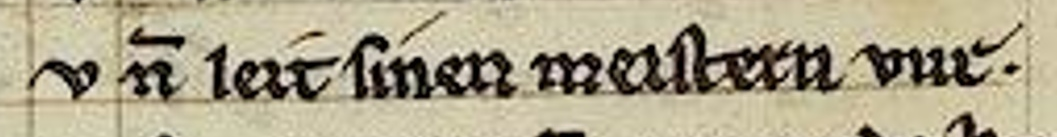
Vn(d) leit ſinen meiſtern vur.
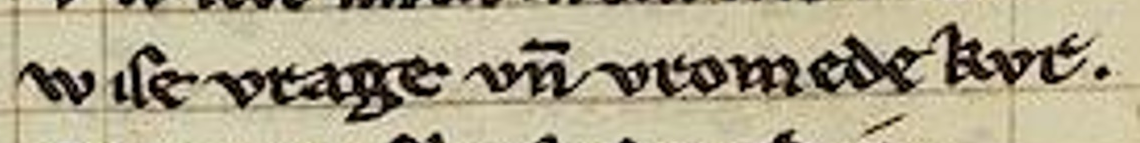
Wiſe vrage vn(d) vromede kvr.
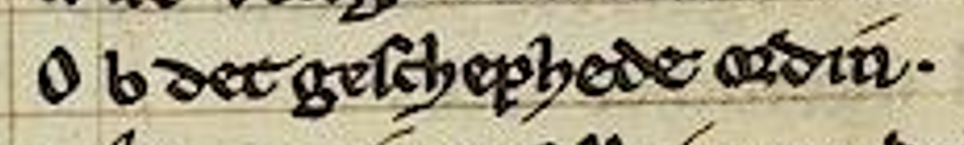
Ob der geſchephede ordin.
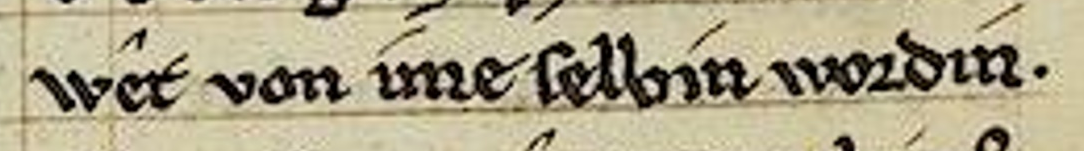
Wer von ime ſelbin wordin.
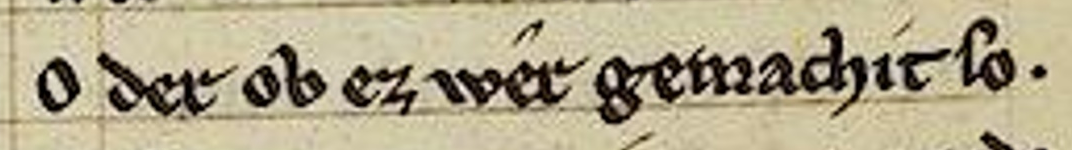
Oder ob ez wer gemachit ſo.
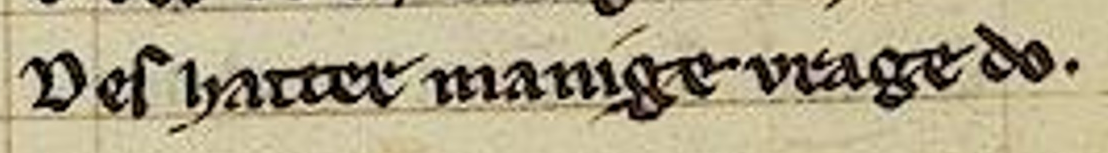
Deſ hatter manige vrage do.
